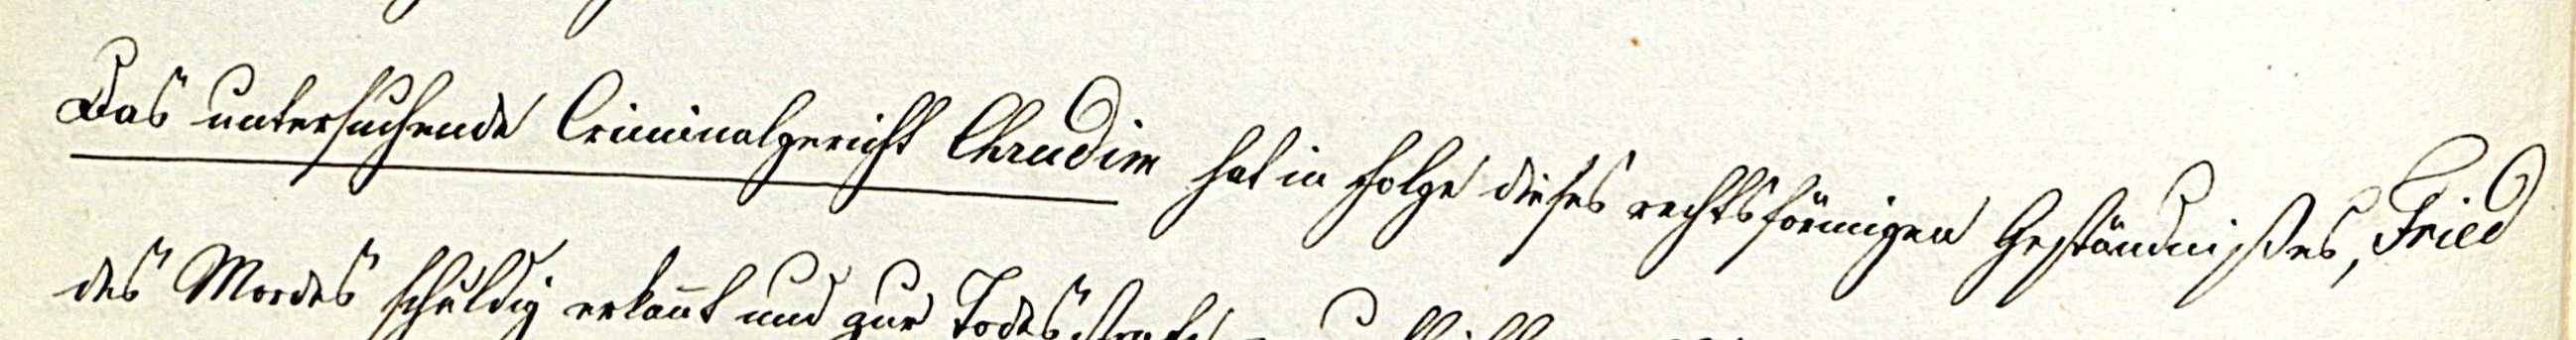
Das untersuchende Criminalgericht Chrudim hat in Folge dieses rechtsförmigen Geständnißes, Fried
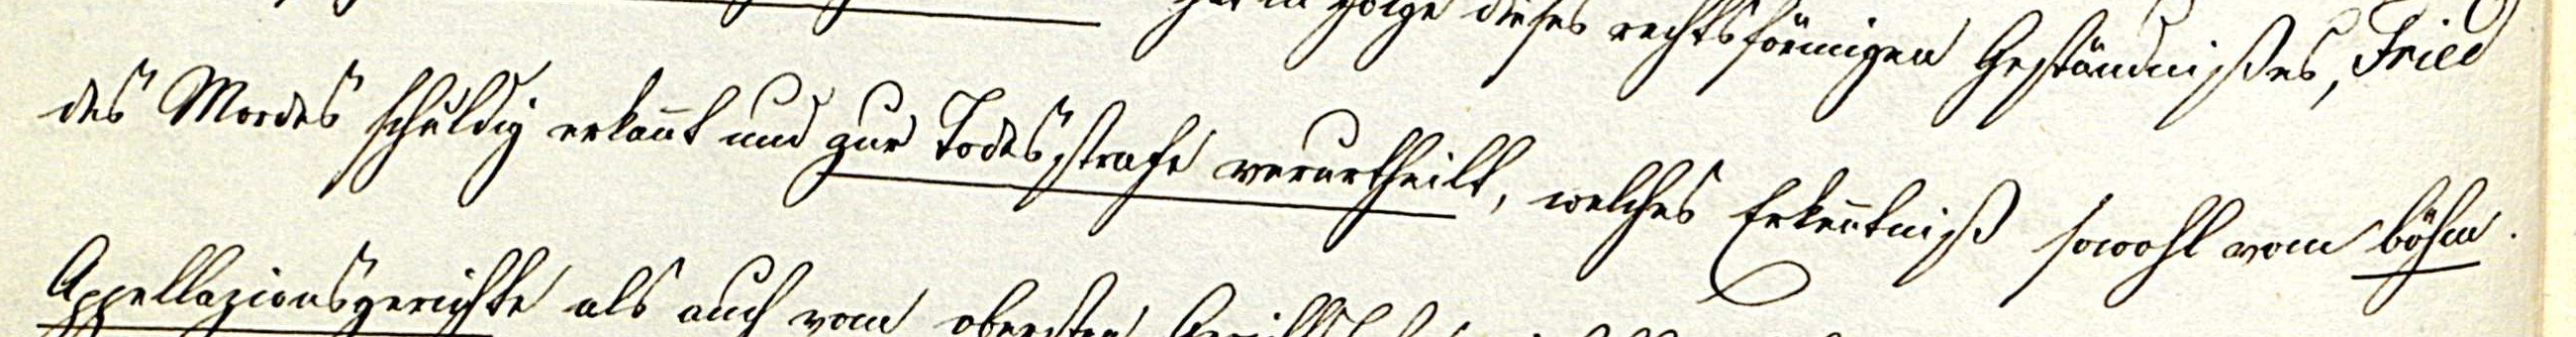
des Mordes schuldig erkannt und zur Todesstrafe verurtheilt, welches Erkenntniß sowohl vom böhm.
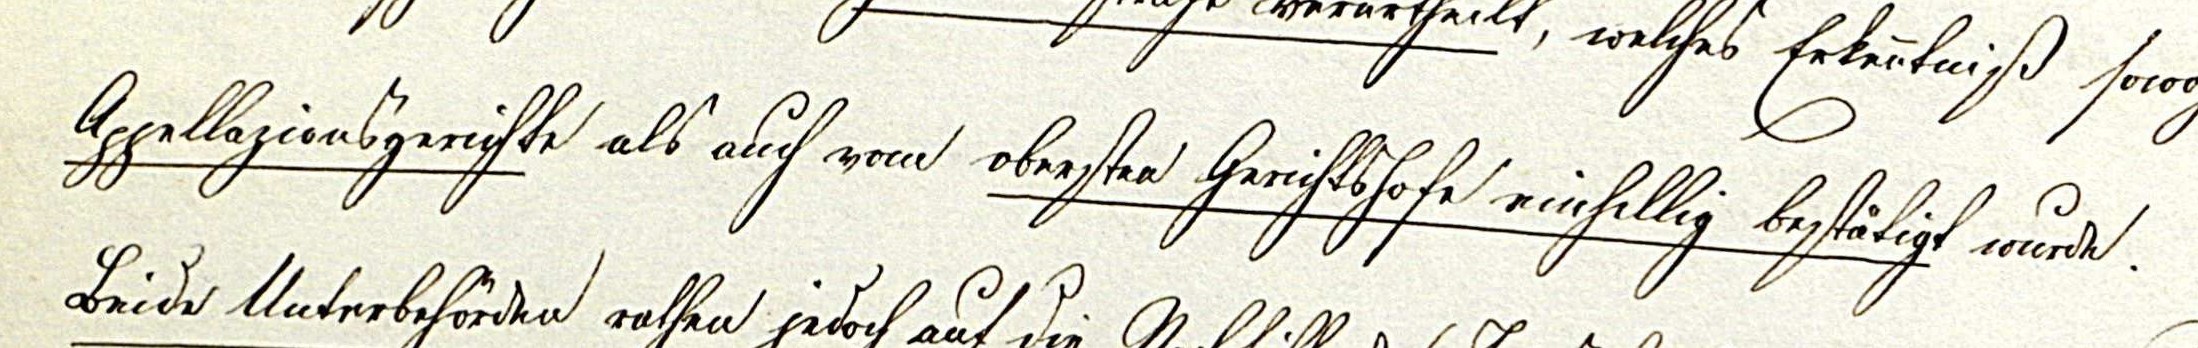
Appellazionsgerichte als auch vom obersten Gerichtshofe einhellig bestätigt wurde.
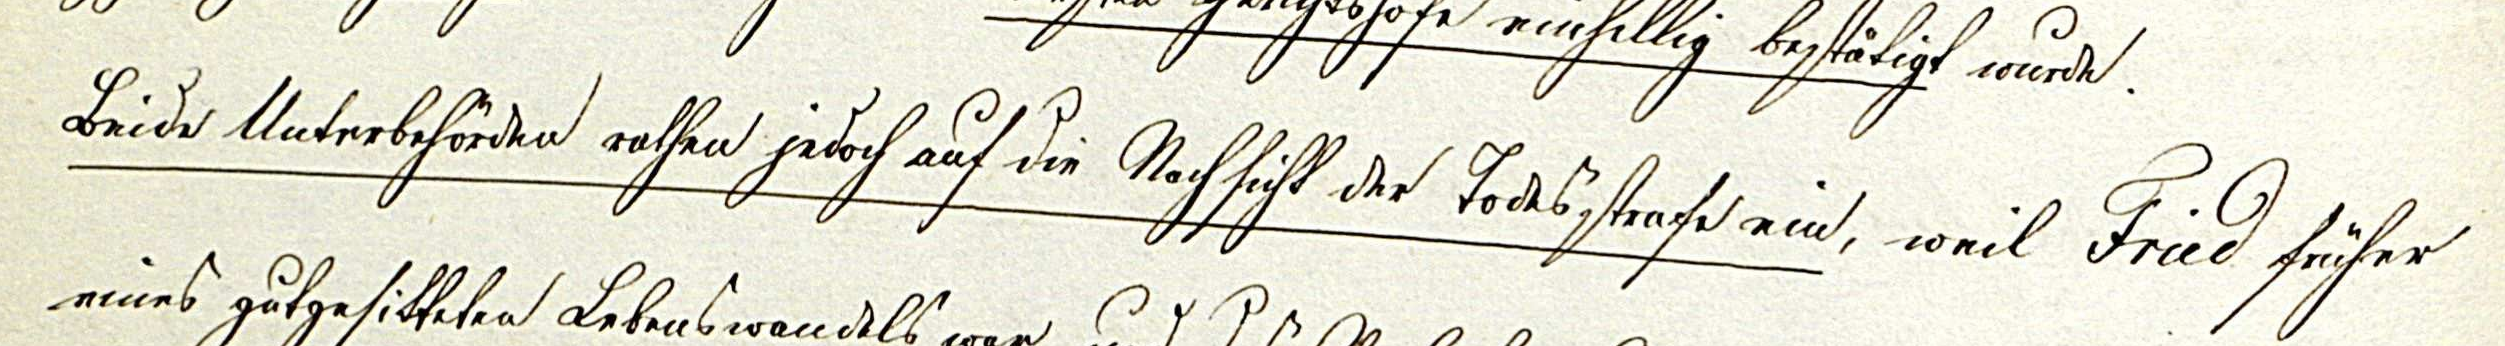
Beide Unterbehörden rathen jedoch auf die Nachsicht der Todesstrafe ein, weil Fried früher
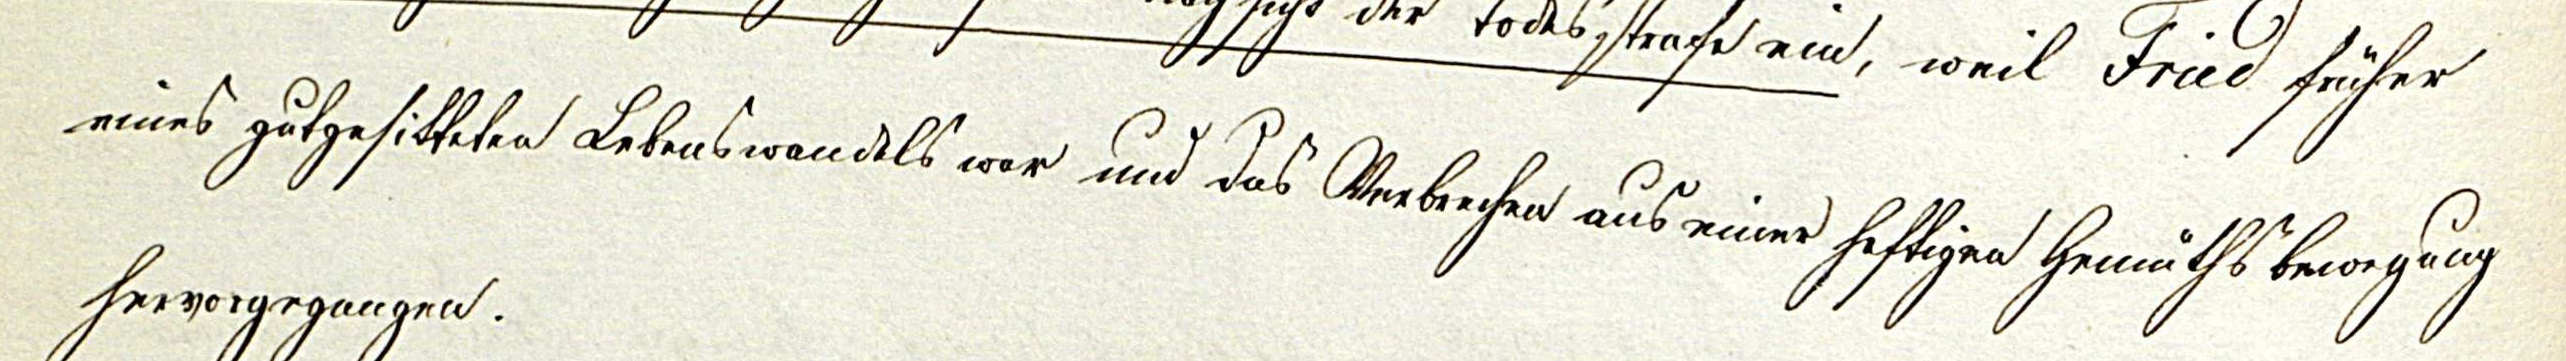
eines gutgesitteten Lebenswandels war und das Verbrechen aus einer heftigen Gemüthsbewegung
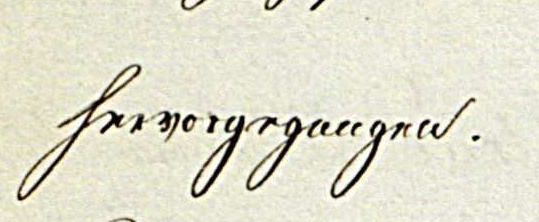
hervorgegangen.
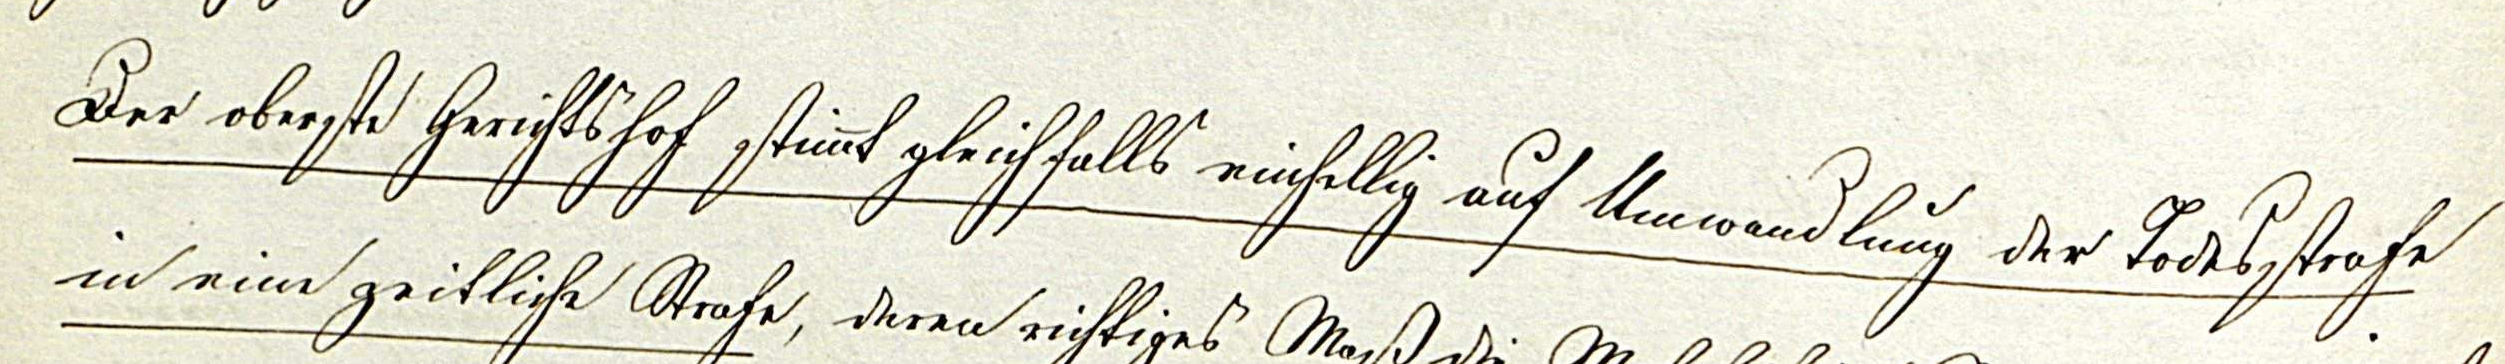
Der oberste Gerichtshof stimmt gleichfalls einhellig auf Umwandlung der Todesstrafe
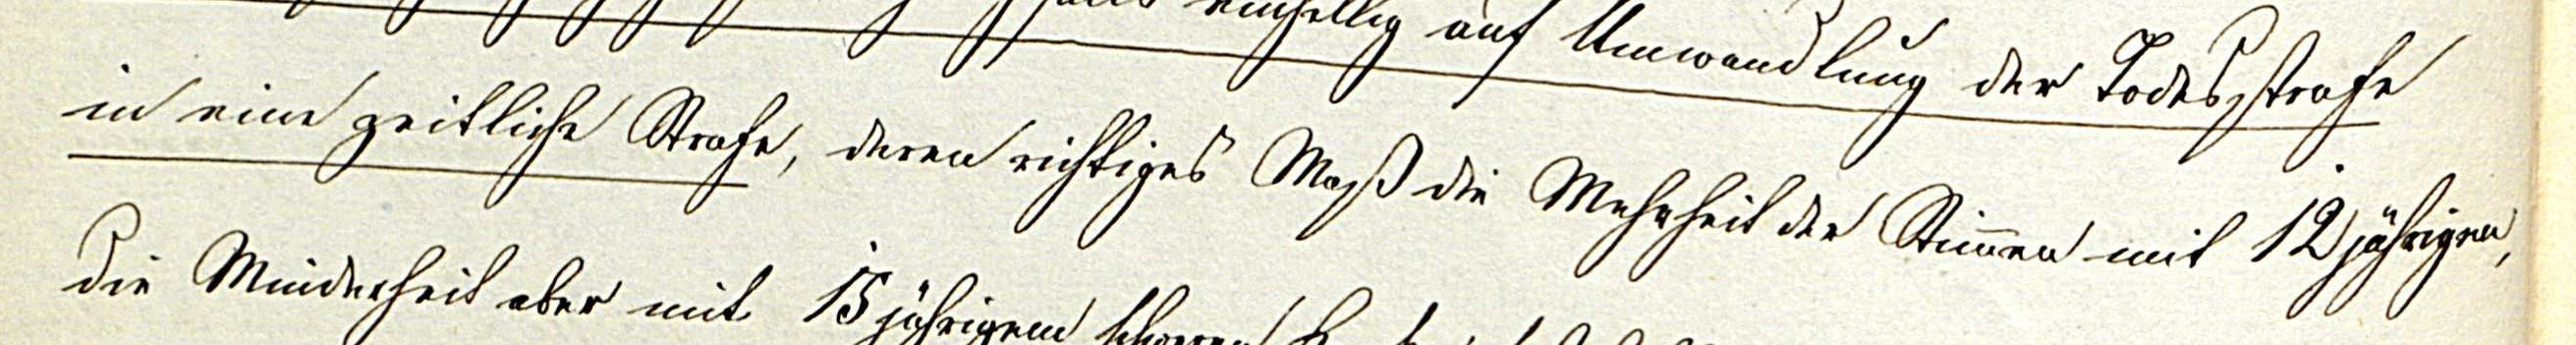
in eine zeitliche Strafe, deren richtiges Maß die Mehrheit der Simmen mit 12jährigen,
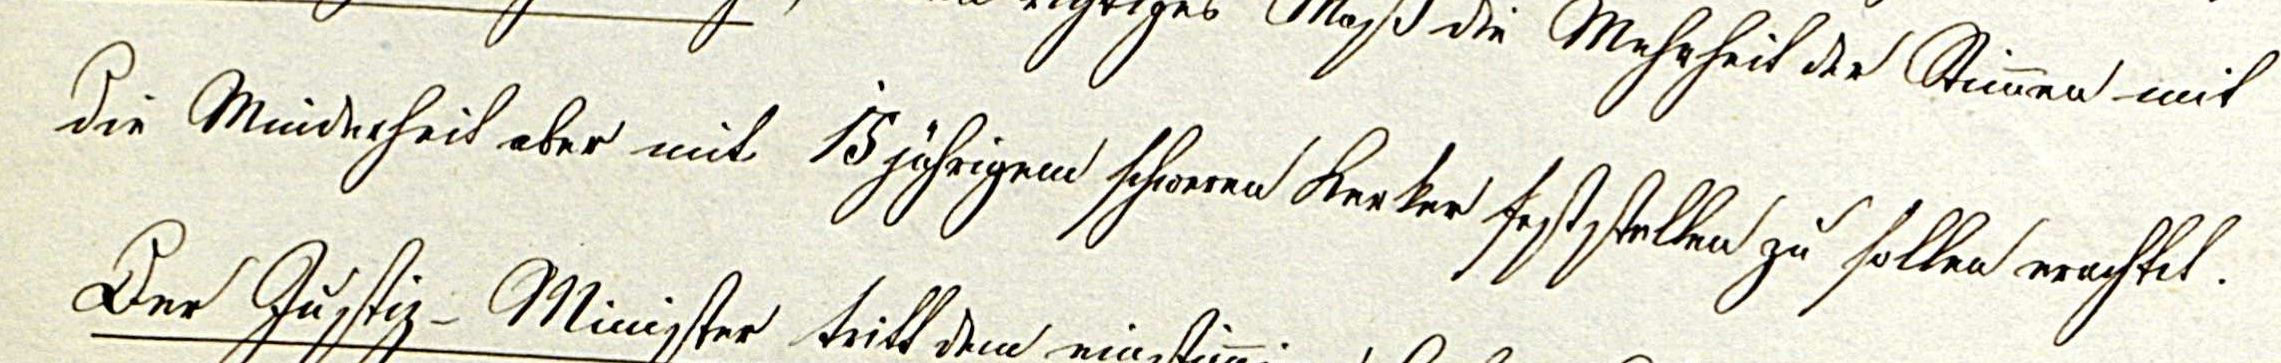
die Minderheit aber mit 15jährigen schweren Kerker feststellen zu sollen erachtet.
